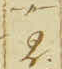2.
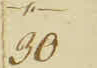30
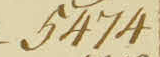5474
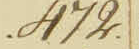472. 6.
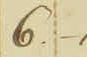472. 6.
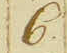6.
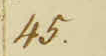45.
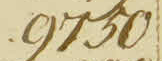9750
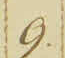9.
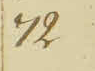72
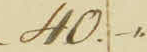40.
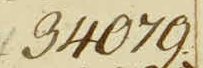34079.
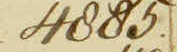4885.
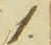1.
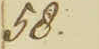58.
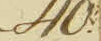40.
